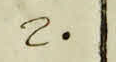2.
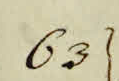63
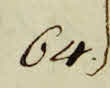64
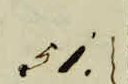51.
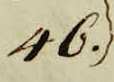46
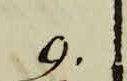9.
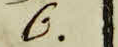6.
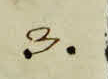3.
